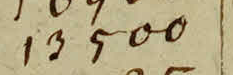13500
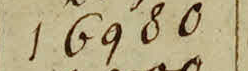16980
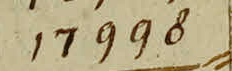17998
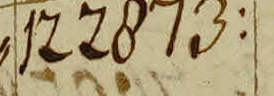122873
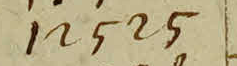12525
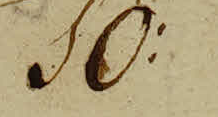10:
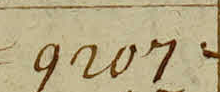9207
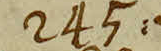245
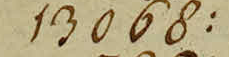13068
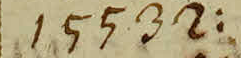15532
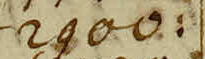2900
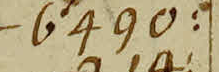6490
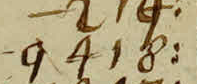9418
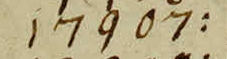17907
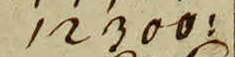12300
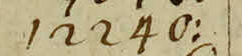12240:
